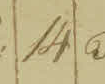14
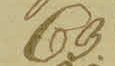63.
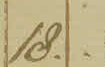18.
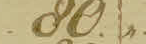80.
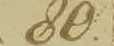80.
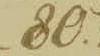80.
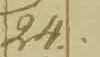24.
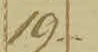19.
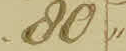80
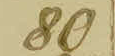80
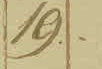19.
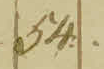54.
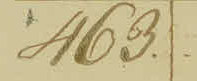463.
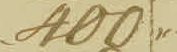400
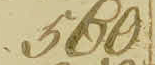560
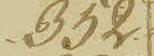352
